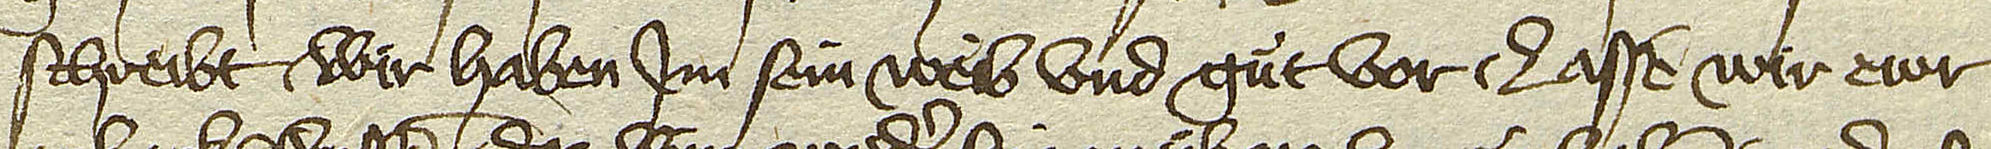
ſchreibt / wir haben Im ſein weib vnd güt vor / Laſſe* wir ewr
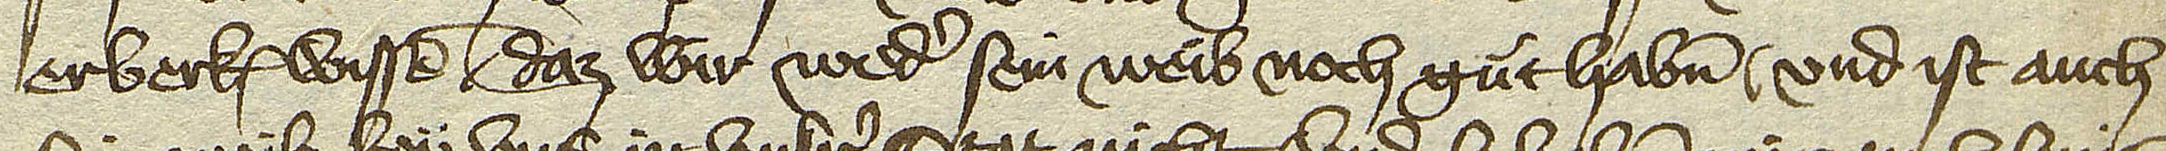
erberk* wiſſe* / daʒ wir wed* ſein weib noch güt habn* / vnd iſt auch
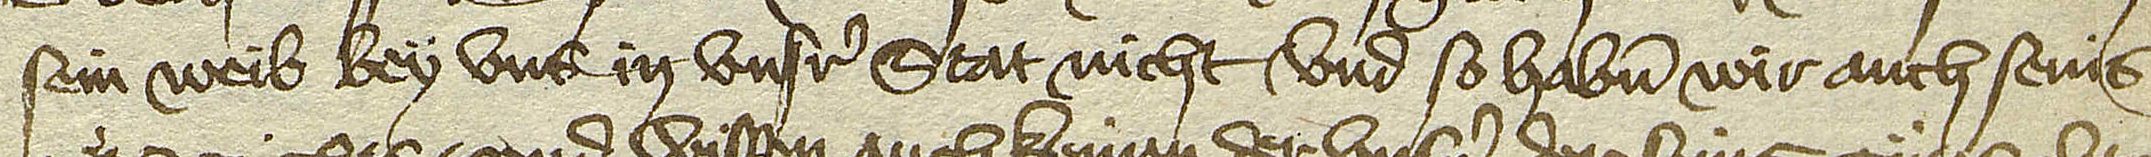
ſein weib bey vns in vnſr* Stat nicht / vnd ſo habn* wir auch ſeins
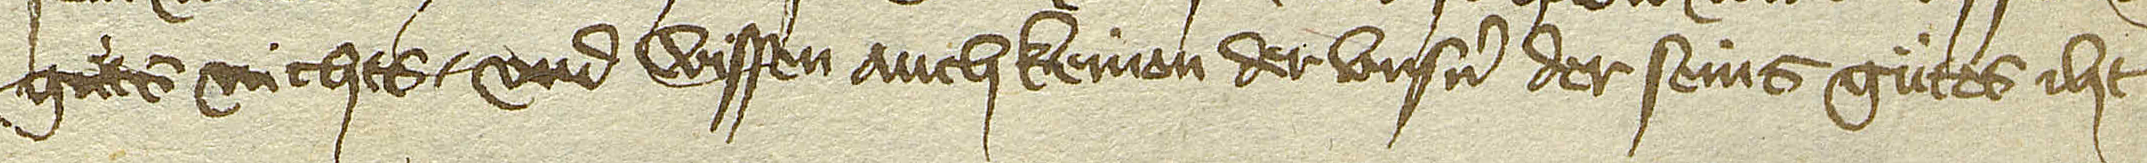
güts nichts / vnd wiſſen auch keinen der vnſn* der ſeins gütes iht
